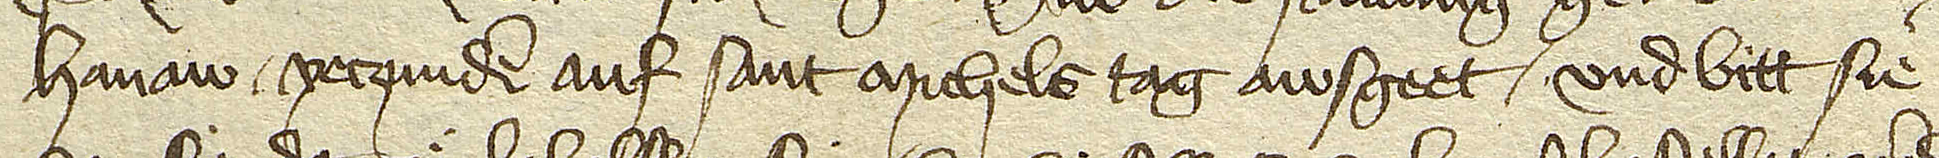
hanaw / yecʒund* auf ſant Michels tag awſgeet / . vnd bitt ſie
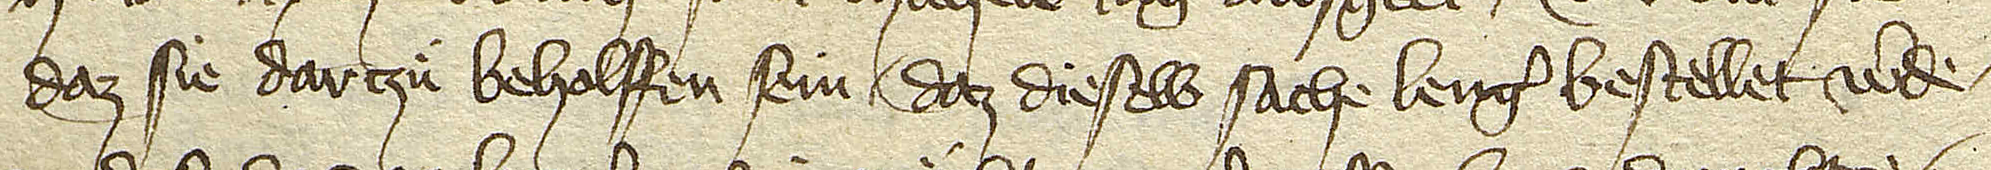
daʒ ſie darcʒü beholffen ſein / daʒ dieſelb ſache leng* beſtellet w*de /
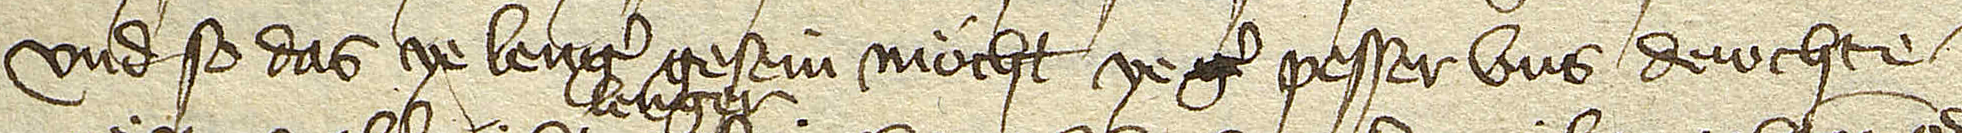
vnd ſo das ye leng* geſein möcht ye g* peſſer vns dewchte /
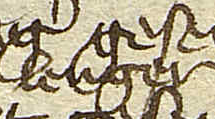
lenger
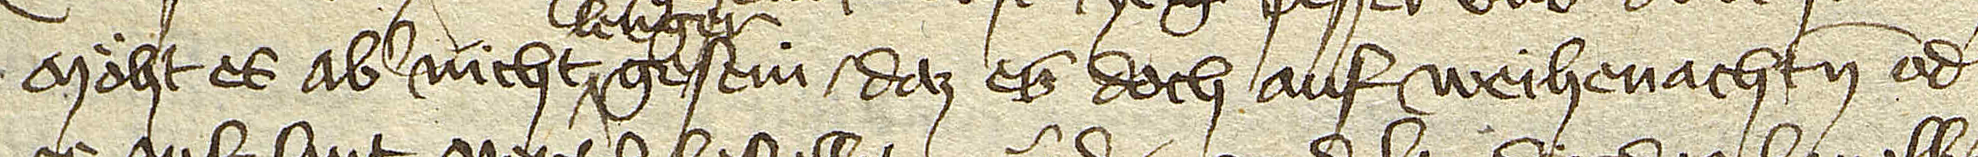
Möht es ab* nicht geſein / daʒ es doch auf weihenachtn* od*
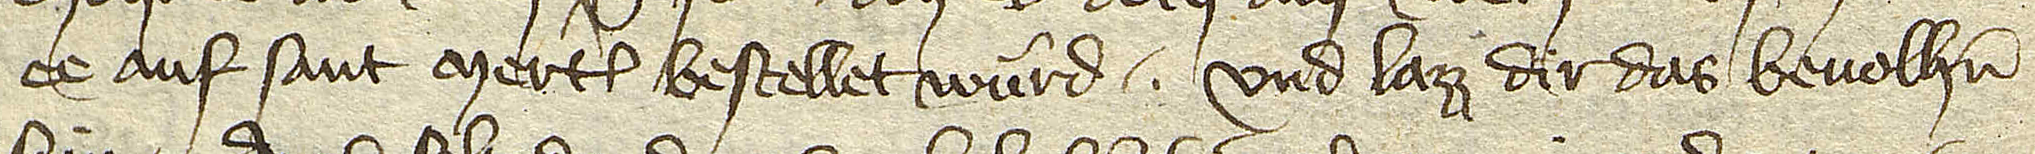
ee auf ſant Mert* beſtellet wurd / . vnd laʒʒ dir das beuolhn*
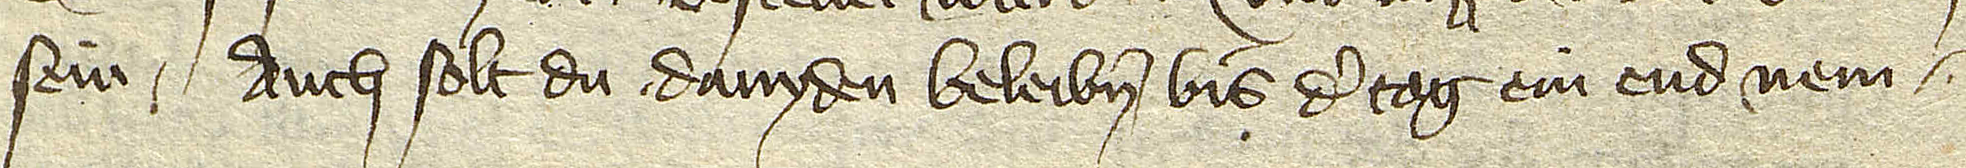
ſein / Auch ſolt du danyden beleibn* bis d* tag ein vnd nem / .
